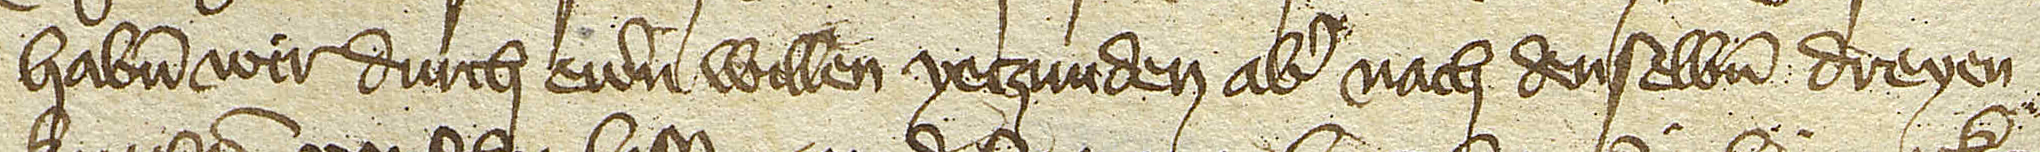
habn* wir durch ew*n willen yecʒunden ab* nach denſelbn* dreyen
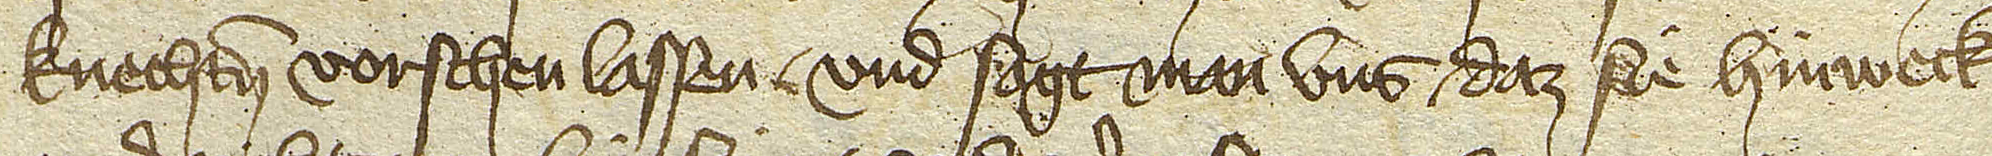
knechtn* vorſchen laſſen / vnd ſagt man vns / daʒ ſie hinweck
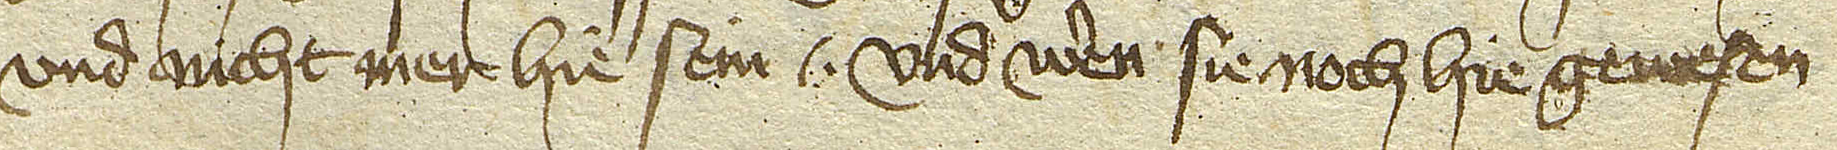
vnd nicht mer hie ſein / . vnd w*en ſie noch hie geweſen
